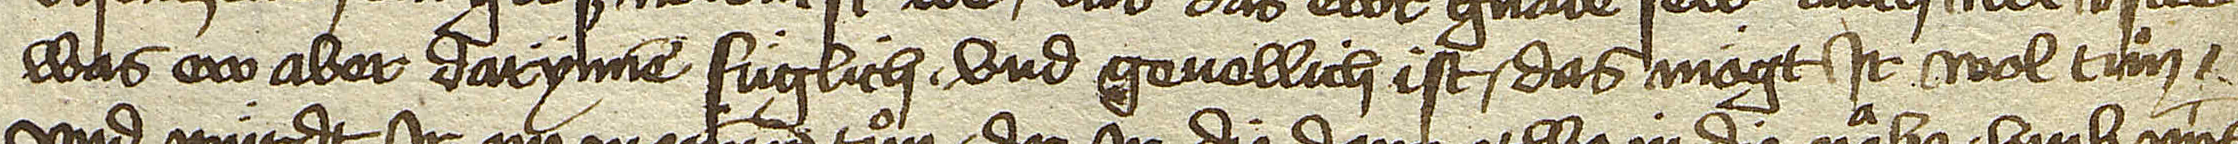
was ew aber darynne* füglich / vnd geuellich iſt / das mögt Ir wol tün /
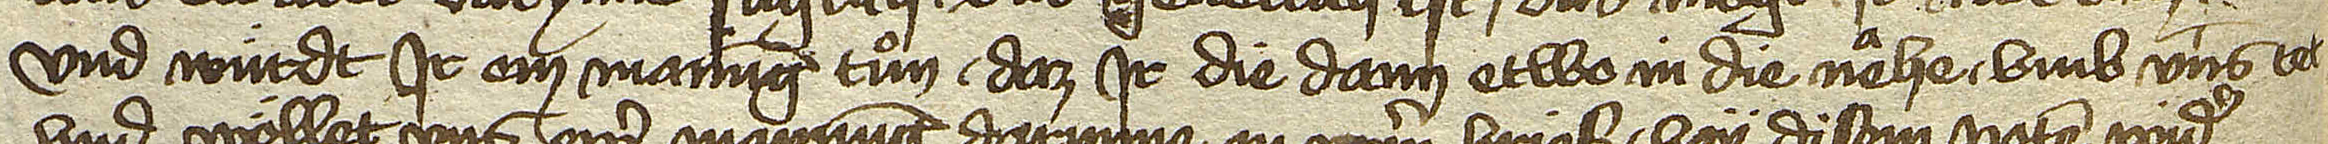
vnd würdt Ir ein manug* tün / daʒ Ir die dann etwo in die nëhe / vmb vns tet
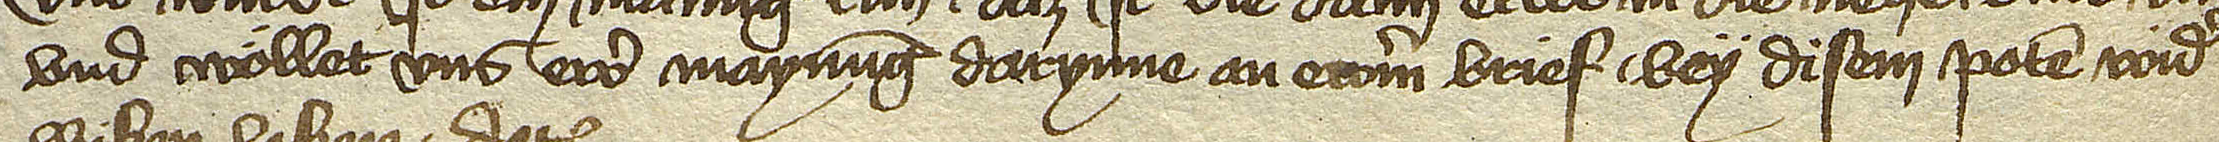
vnd wöllet vns ew* maynug* darynne an ewm* brief / bey diſem pote* wid*
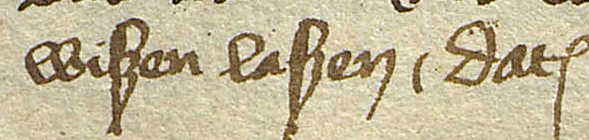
wiſʒen laſʒen / dat*
